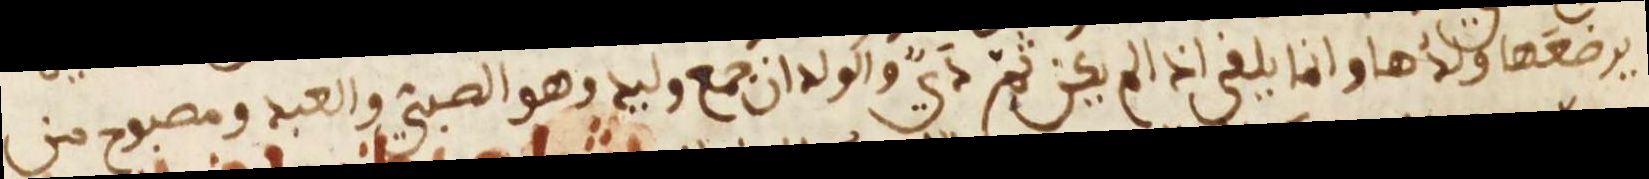يرضعها ولدها و انما يلقى اذا لم يكن ثم دي و الولدان جمع وليد و هو الصبي و العبد و مصبوح من
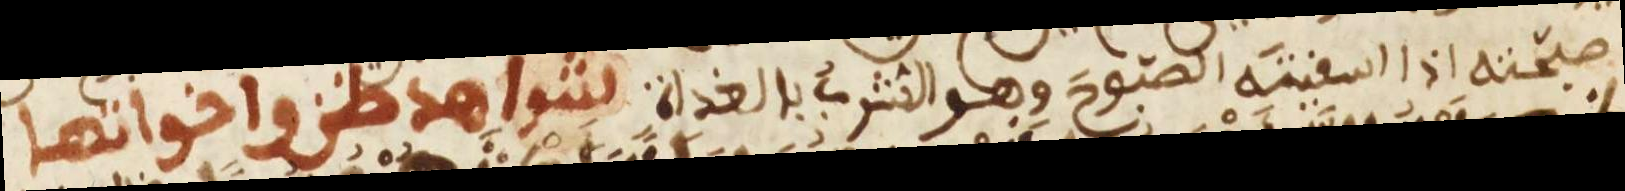صبيحته اذا اسقيته الصبوح و هو الشرب بالغداة شواهد ظن و اخواتها
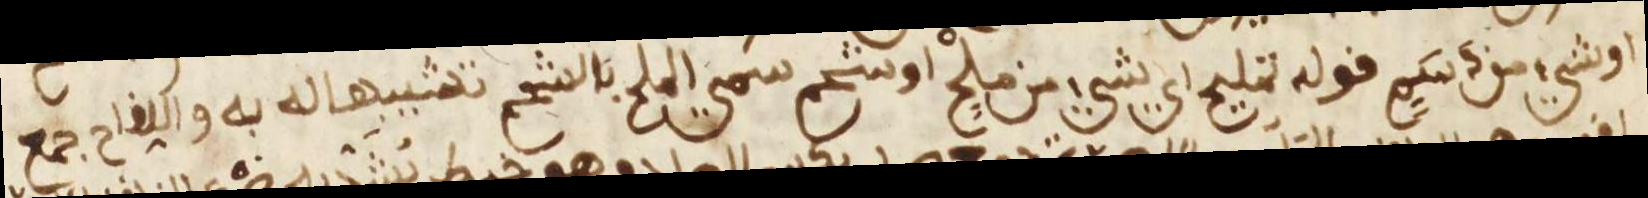او شيء من دسم قوله تمليح اي شيء من ملح او شحم سمي الملح بالشحم تشبيها له به و اللقاح جمع
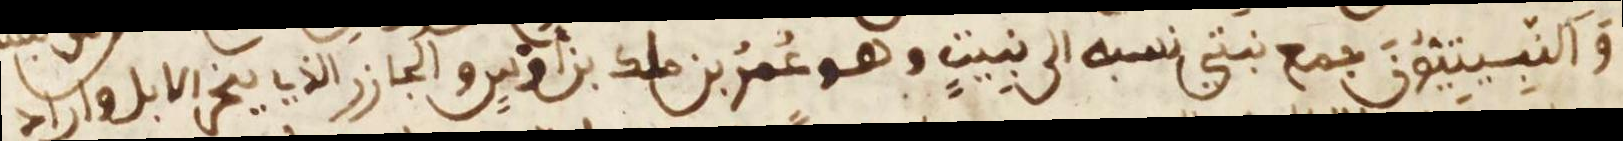و النبيتيون جمع نبتي نسبه الي نبيت و هو عمر بن ملك بن أوس و الجازر الذي ينحر الابل و اراد
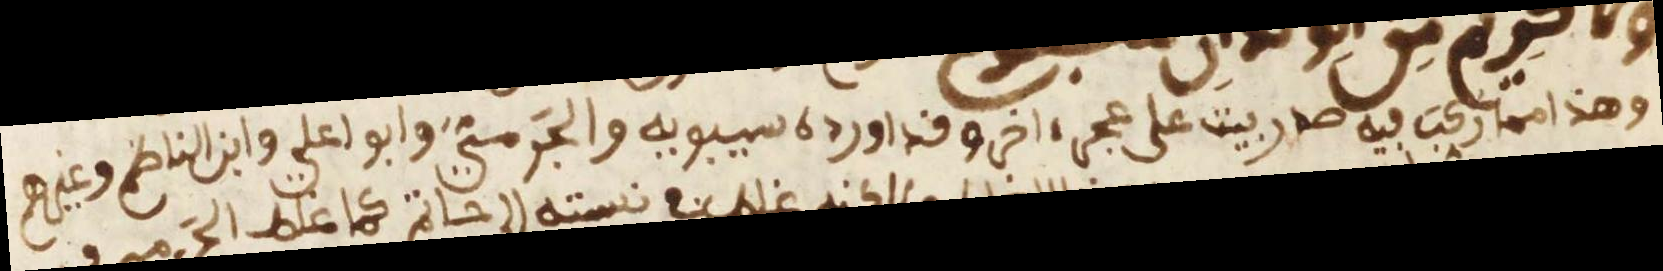و هذا مما ركب فيه صدر بيت على عجر ءاخر و قد اورده سيبويه و الجرمي و ابو علي و ابن الناظم و غيرهم
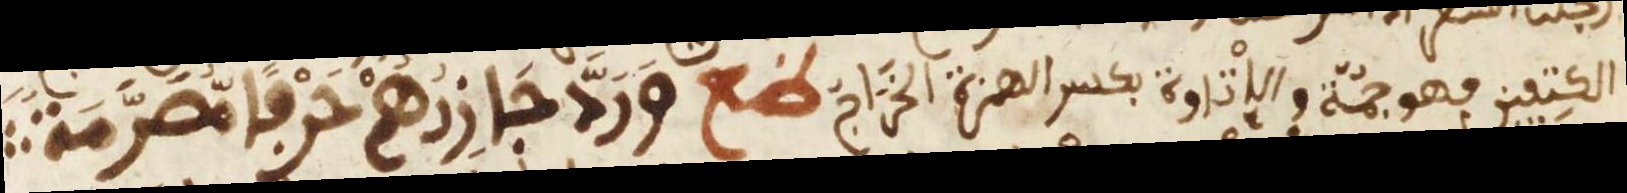الكتفين فهو جمة و الإتاوة بكسر الهمزة الخراج ظع و ردّ جازرهم حرفا مصرمة
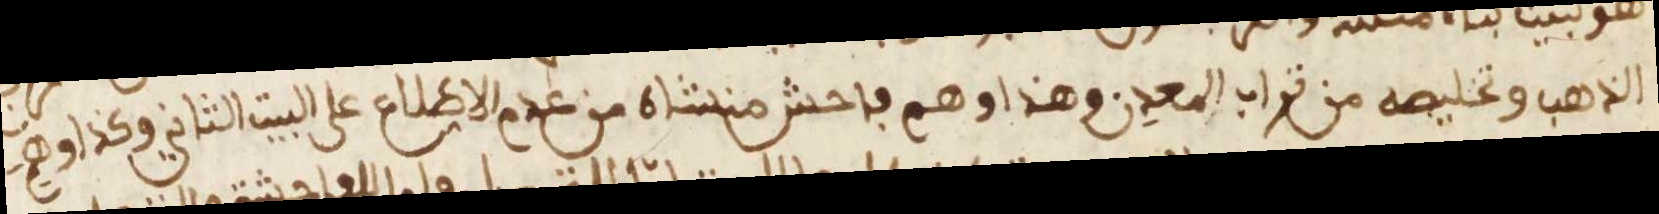الذهب و تخليصه من تراب المعدن و هذا وهم فاحش منشاه من عدم الاطلاع على البيت الثاني و كذا وهم
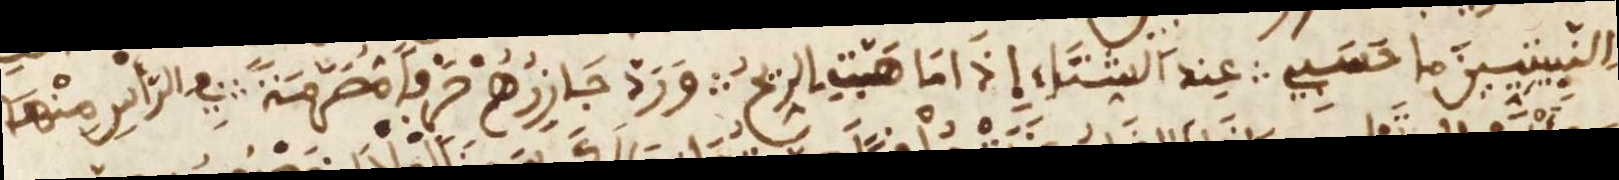النبيتيين ما حسبي عند الشتاء إذا ما هبت الريح و رد جازرهم حرفا مصرمة في الرأس منها
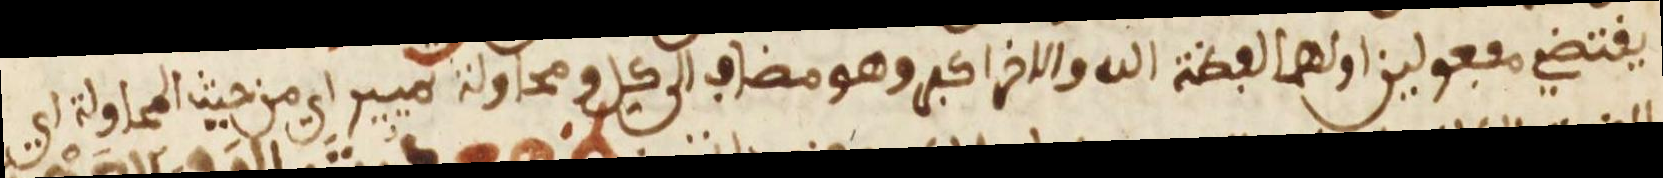يقتضي مفعولين اولهما لفظة الله و الاخر اكبر و هو مضاف الى كل و محاولة تمييز اي من حيث المحاولة اي
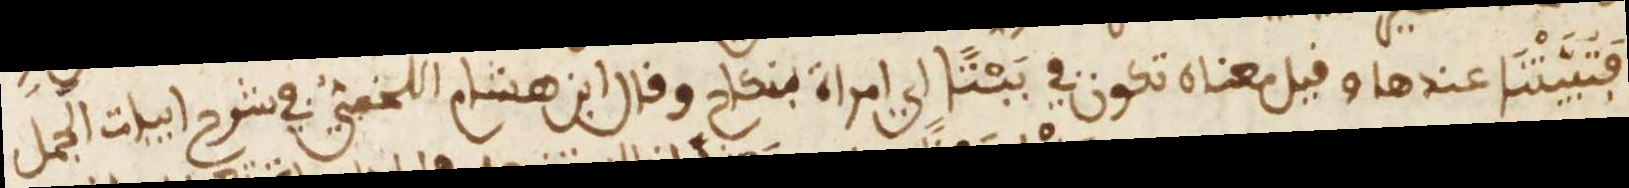فتبيتنا عندها و قيل معناه تكون في ببتا اي امراة بنكاح و قال ابن هشام اللخمي في شرح ابيات الجمل
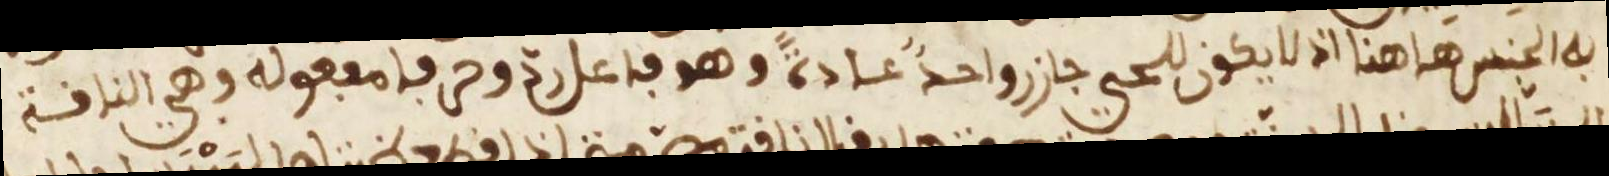به الجنس ها هنا اذ لا يكون للحي جازر واحد عادة و هو فاعل رد و حرفا مفعوله و هي الناقة
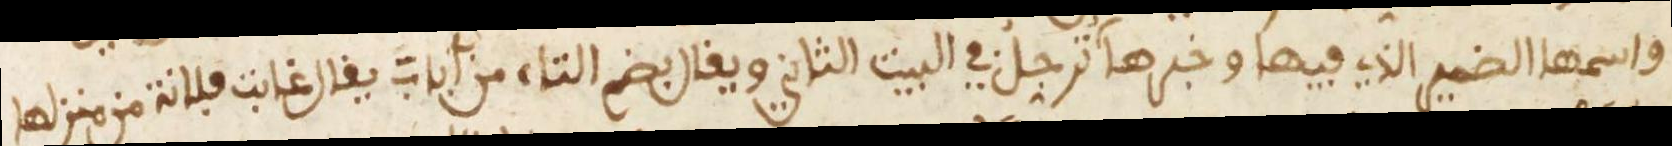و اسمها الضمير الذي فيها و خبرها ترجل في البيت الثاني و يقال بضم التاء من أبات يقال غابت فلانة من منزلها
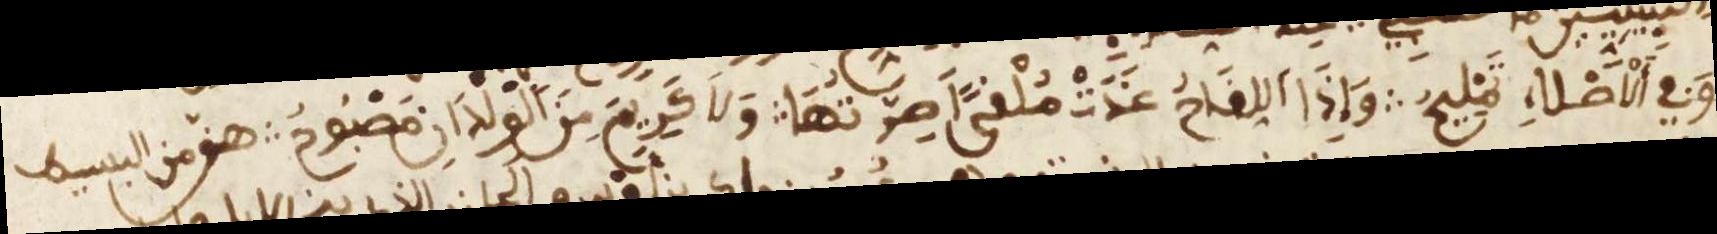و في ألاصلاء تمليح و إذا اللقاح غدت ملقى اصرتها و لا كريم من الولدان مصبوح هن من البسيط
